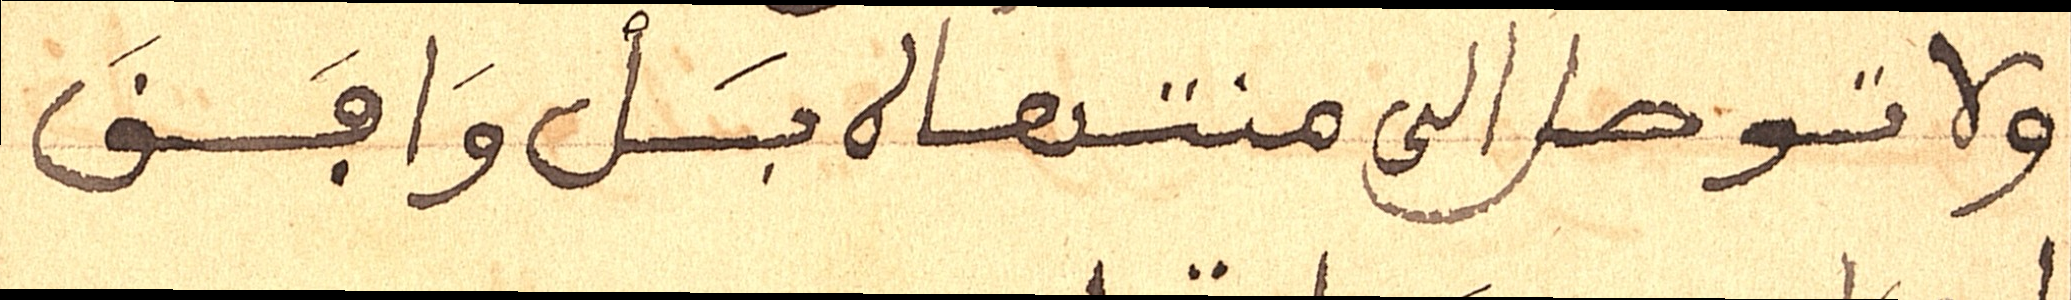ولا توصل الى منتهاه بل وافق
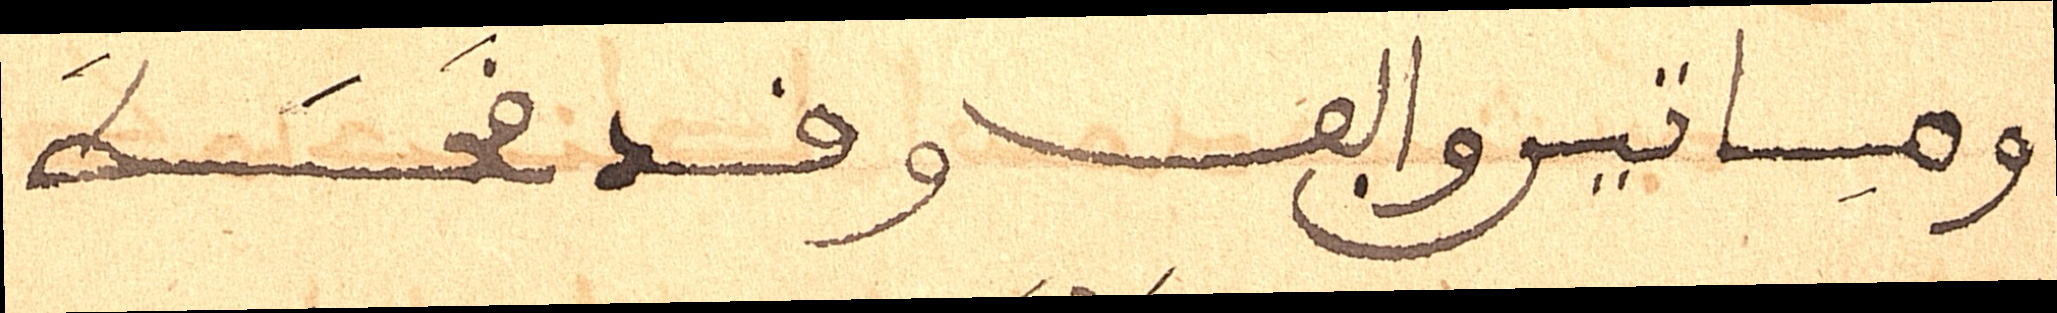وماتين والف وقد قحط
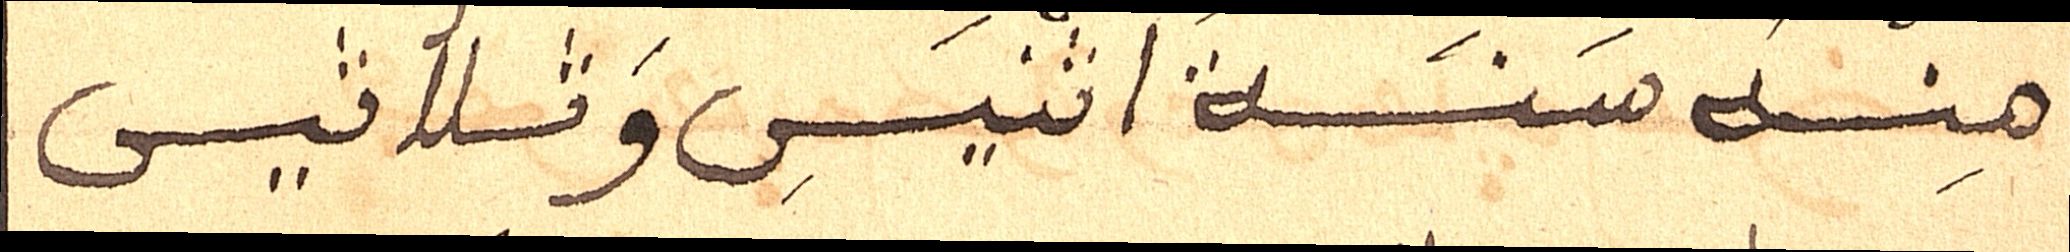منه سنة اثنين وثلاثين
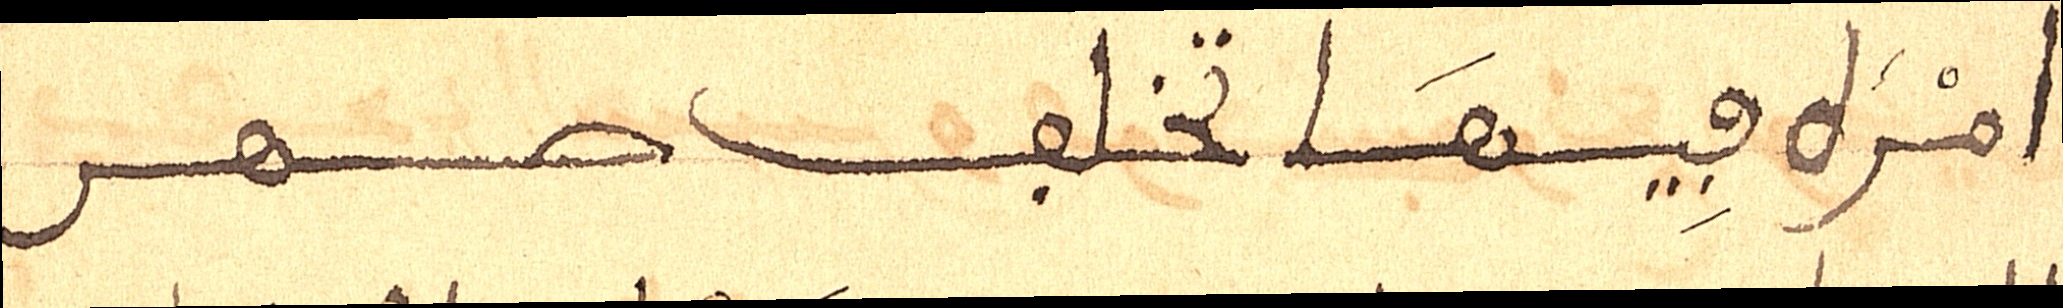امره فيها تخلف صهر
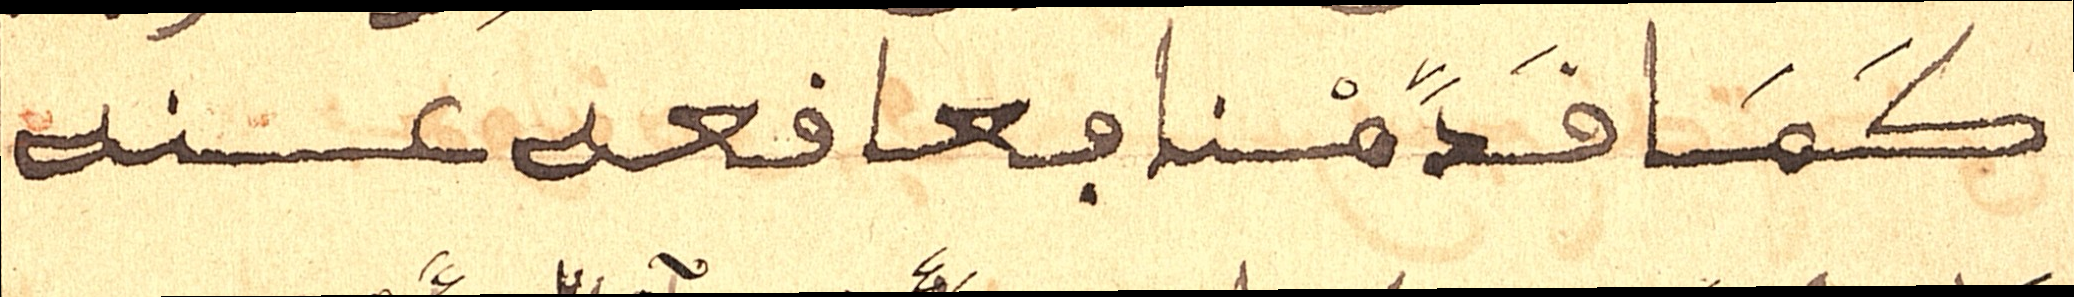كما قد منا فعافعه عنه
